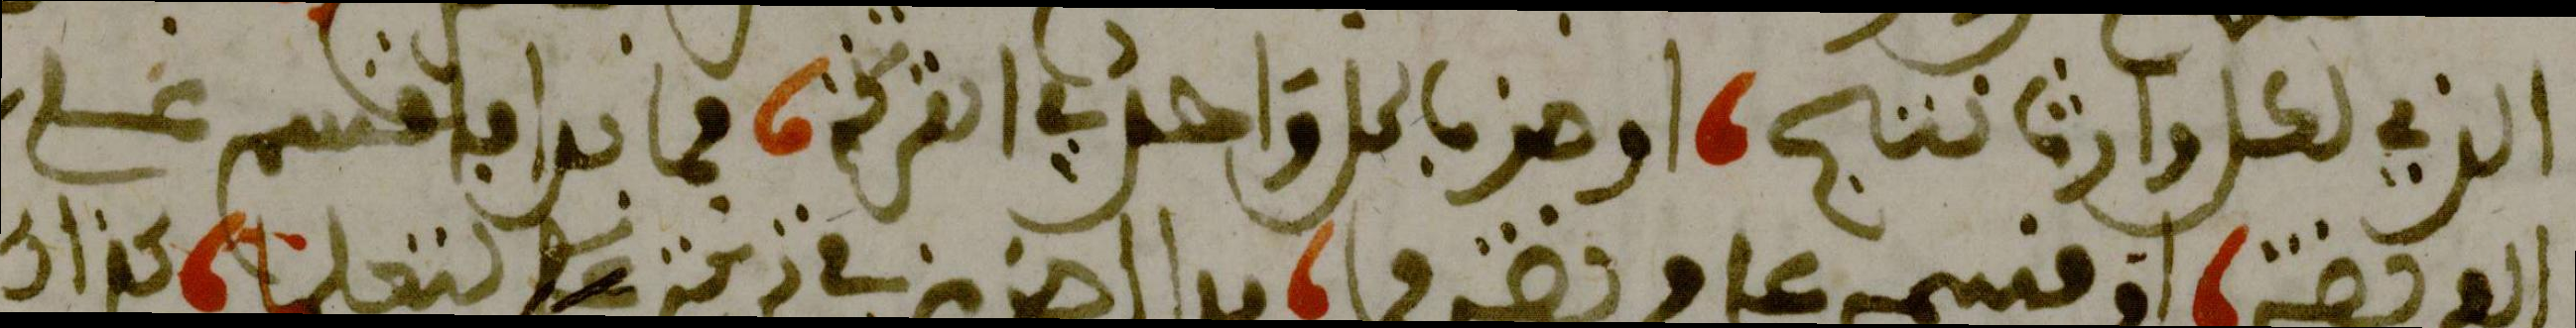الذي لكل وارث نتج او ضرب كل وَاحد في التركة فما بدا فاقسم على
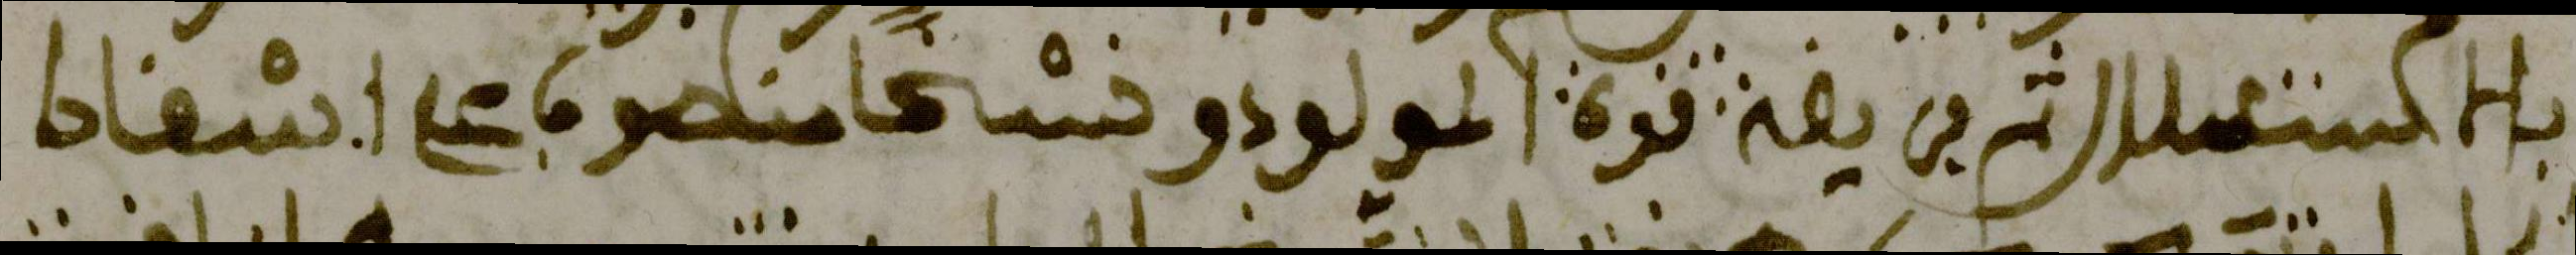بالاستهلال ثم فريضة قوة المولود ونسْخًا منصوب على اسْقاط
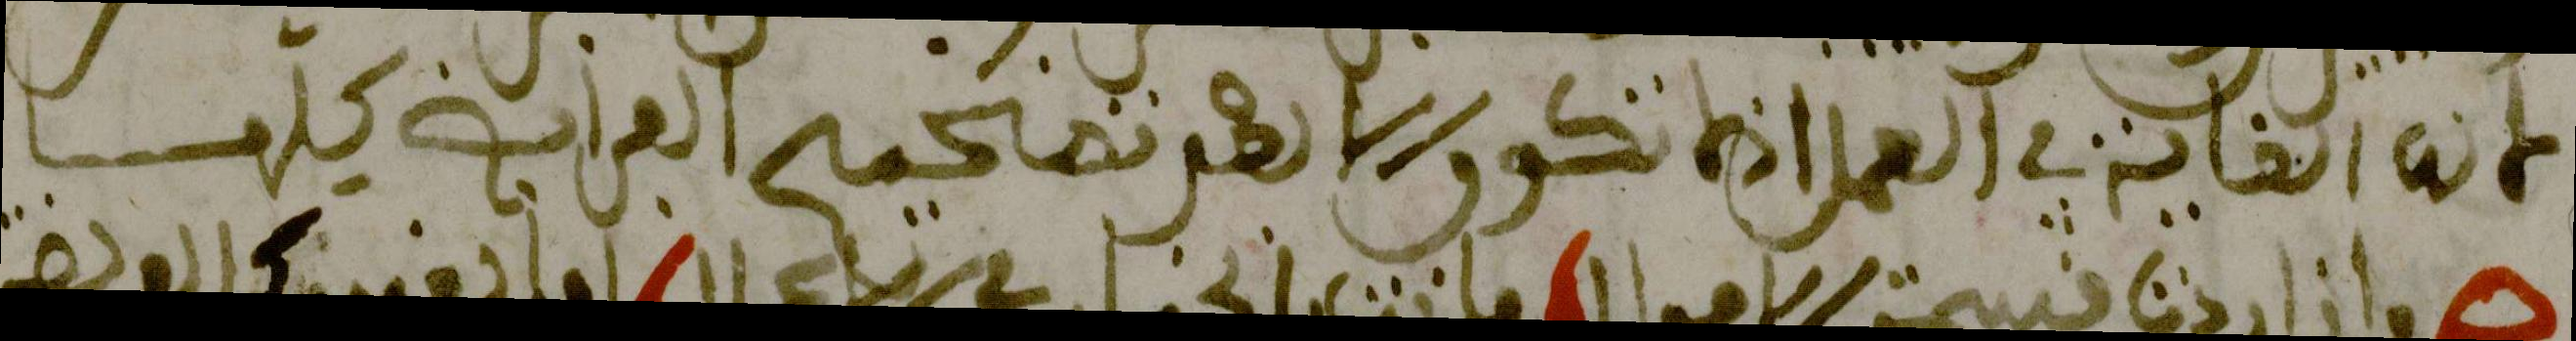لانها الغاية في العمل اذ لا تكون الا بعْد تصحيح الفرايض كلِّها
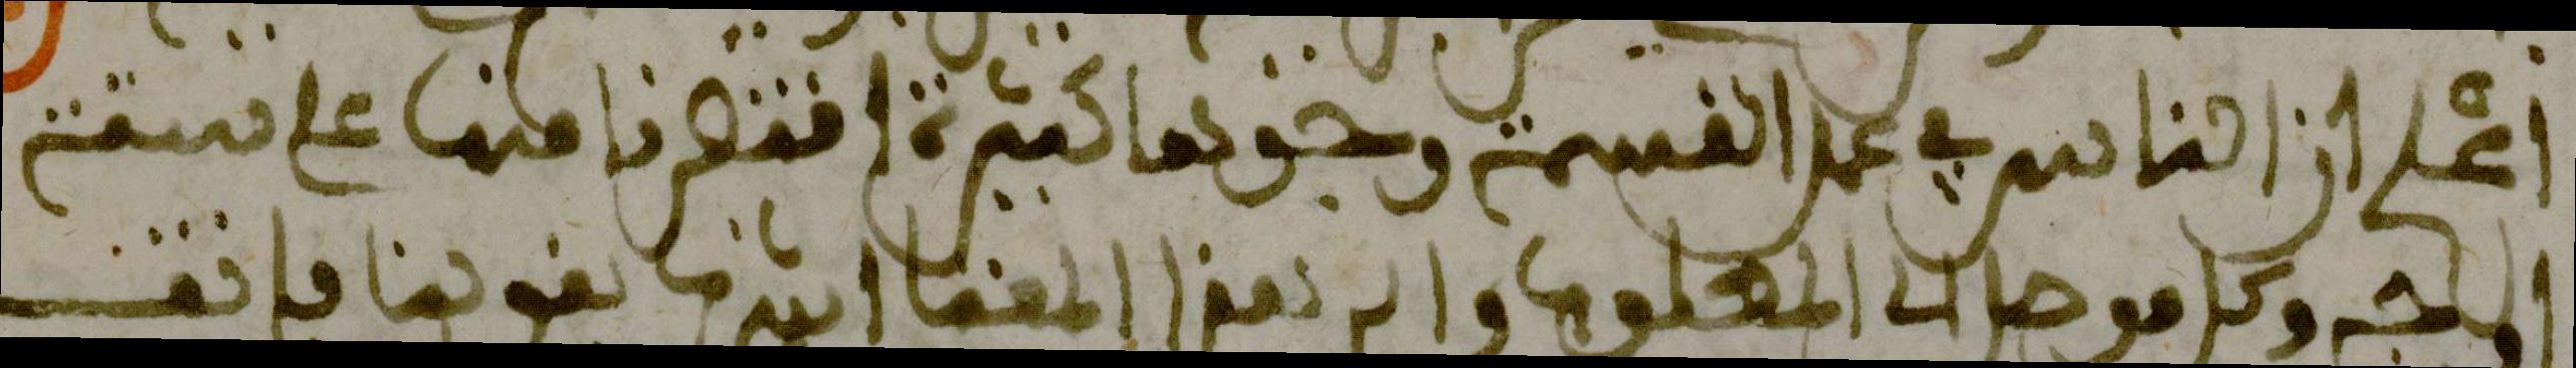اعْلم ان الناس في عمل القسمة وجوها كثيرة اقتصنا منها على ستة
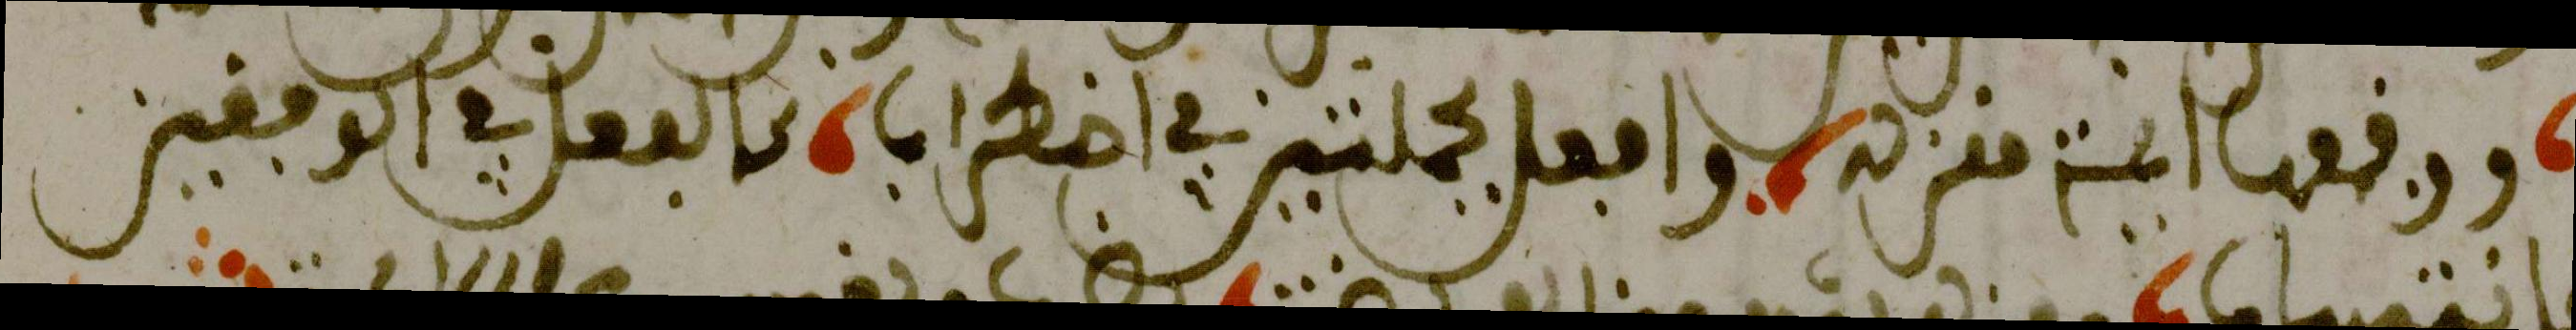ووفقها ايمة منزله وافعل بجملتين في اضطراب كالفعل في الوفقين
